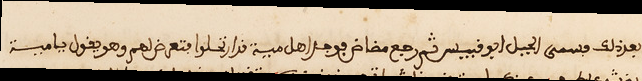بعد ذلك فسمى الجبل أبو قبيس ثم رجع مضاض فوجد اهل مية قد ارتحلوا فتعرض لهم وهو يقول يا مية
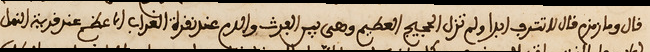قال وما زمزم قال لا تترف ابرا ولم تزل الحجيج العطيم وهي بين الفرث والدم عند نقرة الغراب الأعظم عند قرية النمل
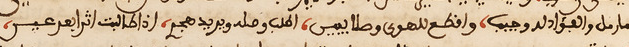ما رمل والفؤاد له وجيب واقطع للهوى وصلا يبين اطلب وصله ويريد هجري اذا طالبت اثرا بعد عين
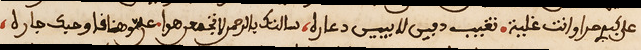على كبرى حرا وانت غلية تغيب دفين لا يبين دعاره سالتك بالرحمن لا تجمعن هوا علىّ وهنانا وحبك جاره
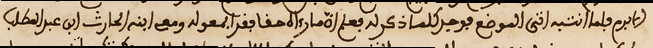الابرم فلما انتبه اتى الموضع فوجد كلما ذكر له فعلم ان ما رءاه حقا فقرا بمعوله ومعى ابنه الحارث ابن عبد المطلب
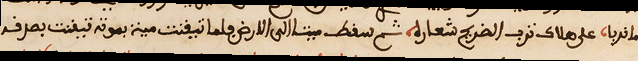ما ندبا على هلاك ترب الضريح شعاره ثم سقط ميتا الى الأرض فلما تيقنت منة بموته تيقنت بصدقه
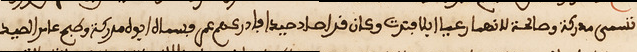تسمى مدركة وصالحة لانهما رعيا ابلا فتدت وكان قد اصاد صيدا فادركهم عمر فسماه ابوه مدركة وطبح عامر الصيد
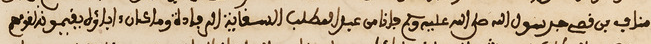مناف بن قصى جد سول الله صلى الله عليه وسلم فانا من عبد المطلب السقاية الرفادة وما كان ءاباؤه يقيمونه لقومهم
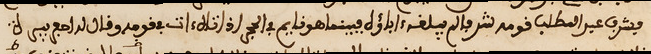فشرف عبد المطلب قومه شرفا لم يبلغه ءاباؤه فبينهما هو نايم في الحجر اذا تاهءات في قومه وقال له احفر بيرة
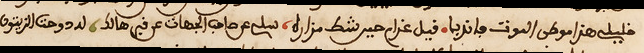خليلى هذا موطن الموت فاندبا قيل غرام حين شط مزاره سلى عمن صاحب الجهات عن قبر هالك له دوحت الزيتون
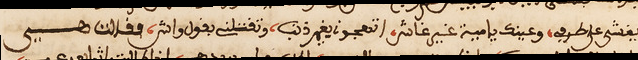يغشى على طرفي وعينك يا مية غير غاش اتهجوني بغير ذنب وتقتلني بقول واش فقالت هي
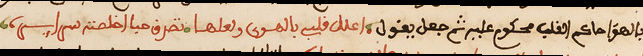بالهوّا حاكم القلب محكوم عليه ثم جعل يقول ا عند قلبي الهوى ولعلها تصدق حبا اخلصته سرائره
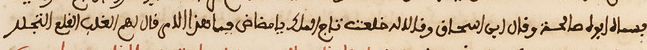فسماه ابوه صالحة وقال ابن اسحاق وقالا له خلعت تاج الملك يا مضاض فما هذا الامر قال لهم الغلب القلع التجلد
